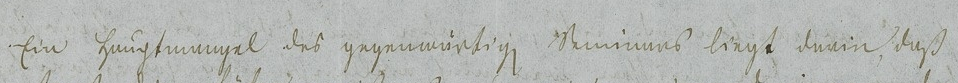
Ein Hauptmangel des gegenwärtigen Seminars liegt darin, daß
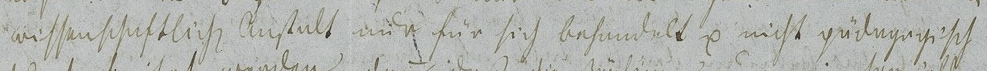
wissenschaftlichen Anstalt nur für sich behandelt & nicht pädagogisch
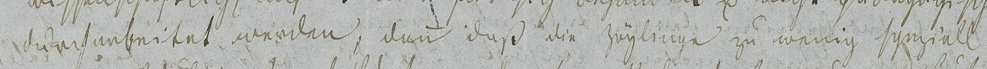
durcharbeitet werden, dann daß die Zöglinge zu wenig speziell
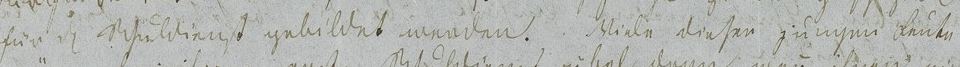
für den Schuldienst gebildet werden. Viele dieser jungen Leute
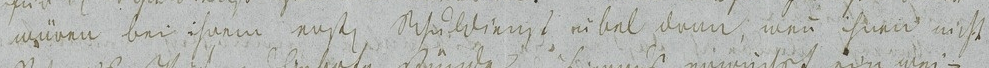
wären bei ihrem ersten Schuldienst übel dran, wenn ihnen nicht
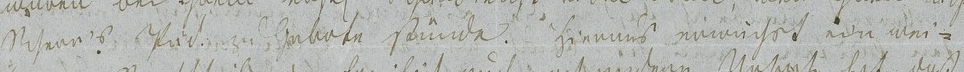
Scherr's Päd. zu Gebote stünde. Hieraus erwächst ein wei-
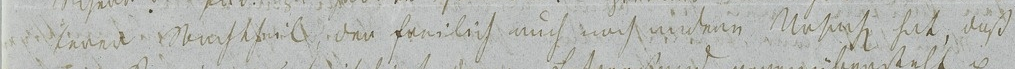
terer Nachtheil, der freilich auch noch andere Ursachen hat, daß
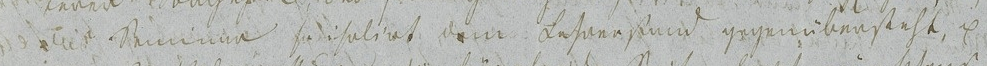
das Seminar so isolirt dem Lehrerstand gegenübersteht, u
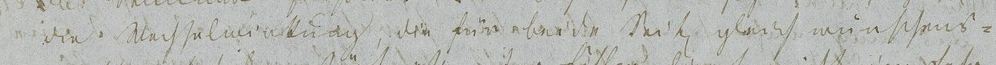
die Wechselwirkung, die für beide Seiten gleich wünschens-
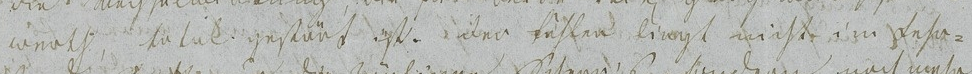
werth, total gestört ist. Der Fehler liegt nicht im Lehr-
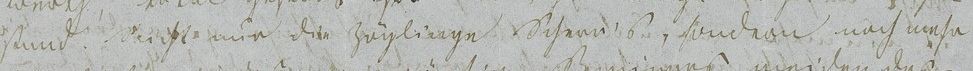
stand. Nicht nur die Zöglinge Scherr's, sondern noch mehr
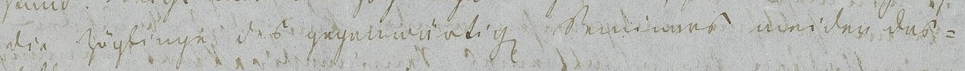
die Zöglinge des gegenwärtigen Seminars meiden das-
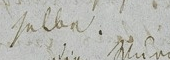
selbe.
